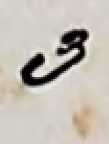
3
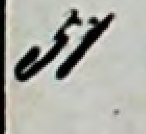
51
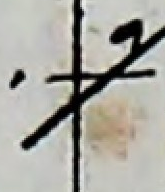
7
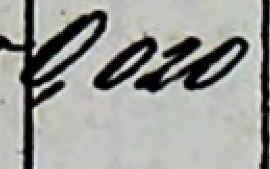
0,020
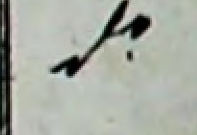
do
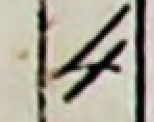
4
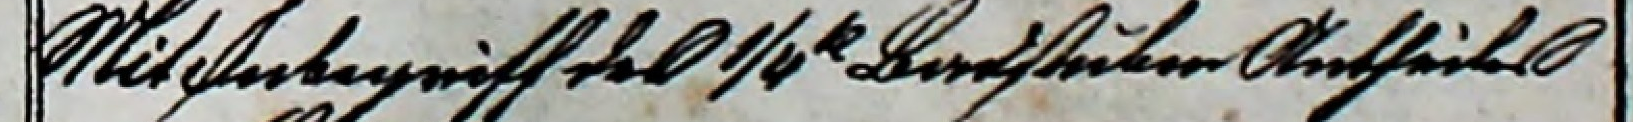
Mit Inbegriff des 1/4 k Baustuben Antheiles
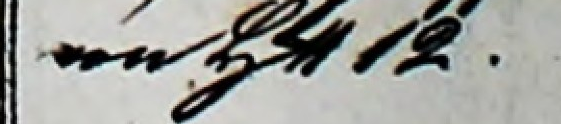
von Hn 12.
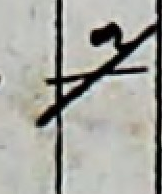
7
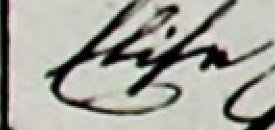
Elise
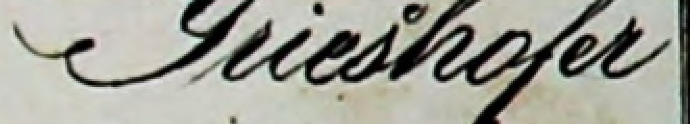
Grieshofer
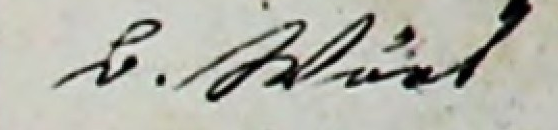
v. Wunt
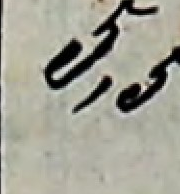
5,5
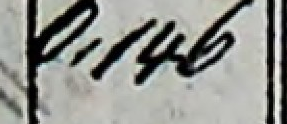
0,146
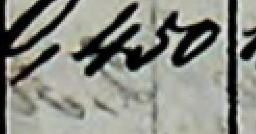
0,450
